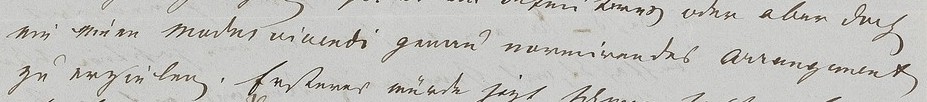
ein einen modus vivendi genau normirendes arrangement
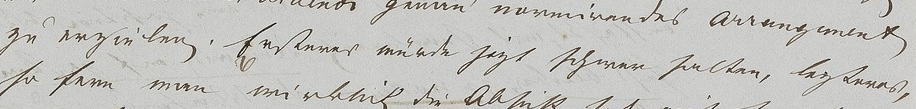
zu erzielen. Ersteres würde jezt schwer halten, lezteres,
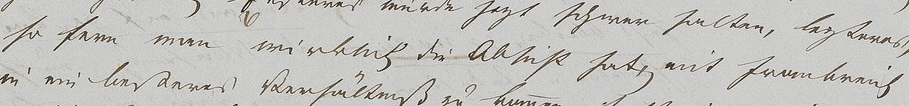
so fern man wirklich die Absicht hat, mit Frankreich
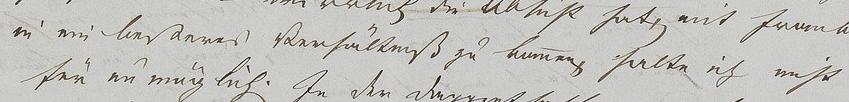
in ein beßeres Verhältniß zu kommen, halte ich nicht
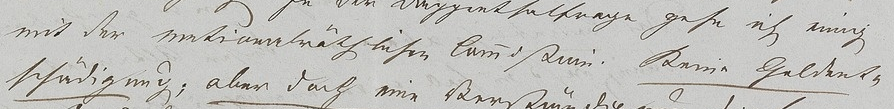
mit der nationalräthlichen Commißion. Keine Geldent-
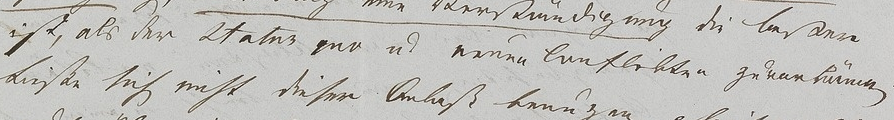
ist, als der Status quo u. neuen Conflikten zuvorkäme. –
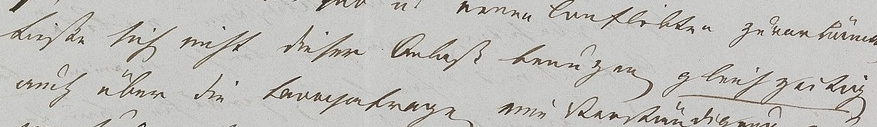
Ließe sich nicht dieser Anlaß benuzen, gleichzeitig
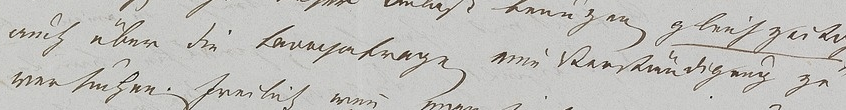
auch über die Savoyer frage eine Verständigung zu
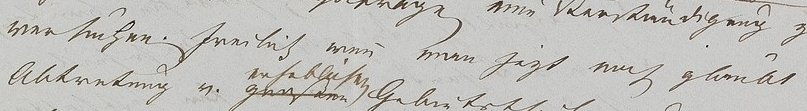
versuchen. Freilich wenn man jezt noch glaubt
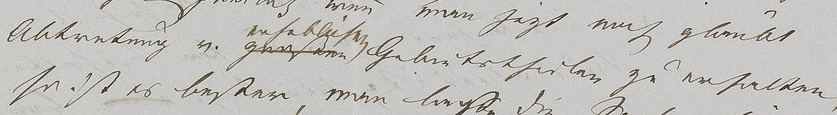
Abtretung v. großenerheblichen Gebietstheilen zu erhalten,
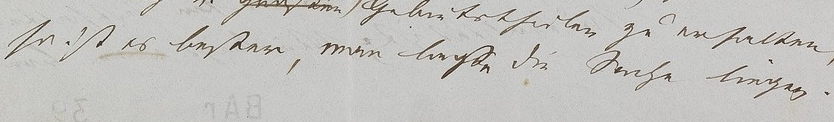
so ist es beßer, man laße die Sache liegen.
